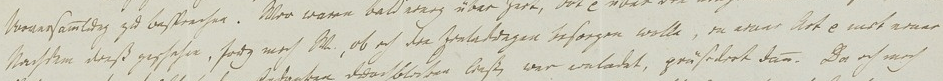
Nachdem dieß geschehen, frug mich W., ob ich die Einladungen besorgen wolle, in einer Art & mit einer
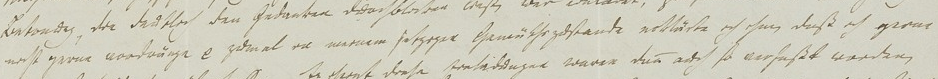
nicht gerne vordränge & zumal in meinem jetzigen Gemüthszustande erklärte ich ihm, daß ich gerne
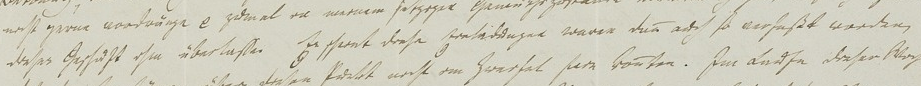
dieses Geschäft ihm überlasse. Es scheint diese Einladungen waren dann auch so verfaßt worden,
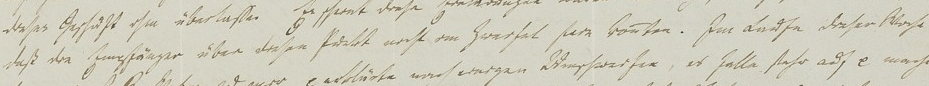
daß die Empfänger über diesen Punkt nicht im Zweifel sein konnten. Im Laufe dieser Woche
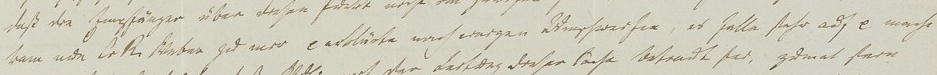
kam nun CrR. Weber zu mir & erklärte nach einigen Umschweifen, es falle sehr auf & mache
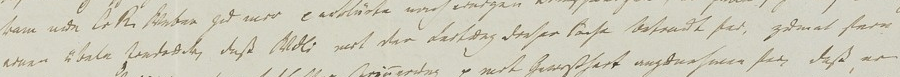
einen übeln Eindruck, daß Wdli mit der Leitung dieser Sache betraut sei, zumal sein
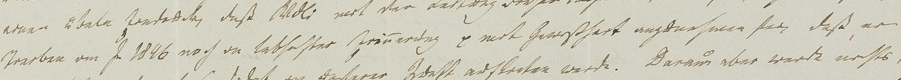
Treiben im J. 1846 noch in lebhafter Erinnerung & mit Gewißheit anzunehmen sei, daß er
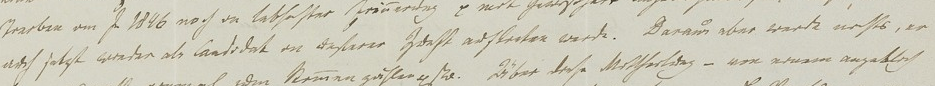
auch jetzt wieder als Candidat in unserer Zunft auftreten werde. Daraus aber werde nichts, er
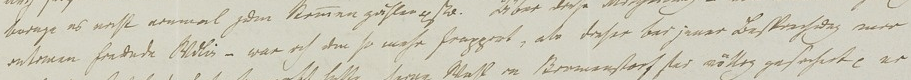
intimen Freunde Wdlis – war ich um so mehr frappirt, als dieser bei jener Besprechung mir
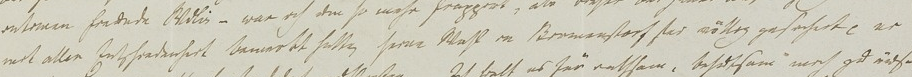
mit aller Entschiedenheit bemerkt hatte, seine Wahl in Birmenstorf sei völlig gesichert & er
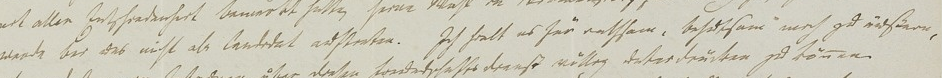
werde bei uns nicht als Candidat auftreten. Ich hielt es für rathsam, behutsam mich zu äußern,
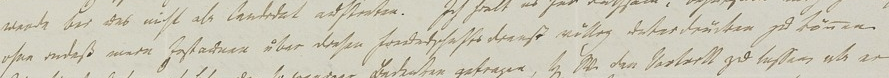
ohne indeß mein Erstaunen über diesen Freundschaftsdienst völlig unterdrücken zu können.
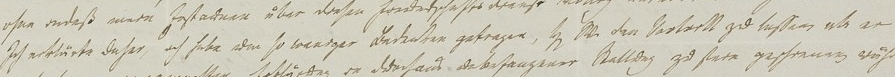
Ich erklärte daher, ich habe um so weniger Bedenken getragen, Herrn W. den Vorteil zu lassen, als er
